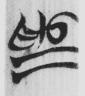爲
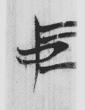𠁩
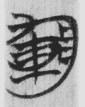軍
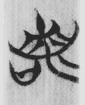若
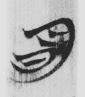明
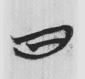日
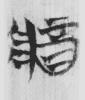𨟻
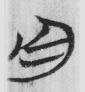舟
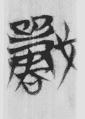戰
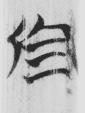於
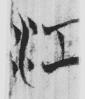江
